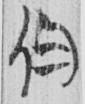於
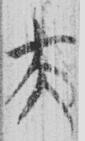夫
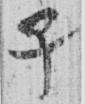子
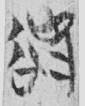欲
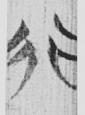行
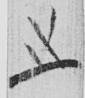之
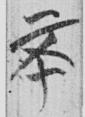不
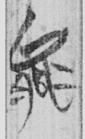能
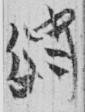欲
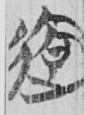迲（去）
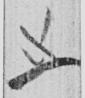之
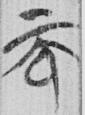而
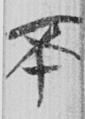不
